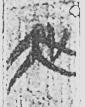吳
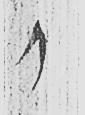人
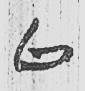㠯（以）
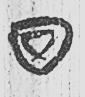回
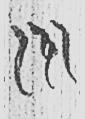州
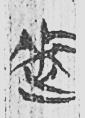麥
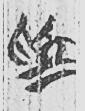爲
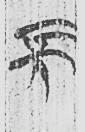長
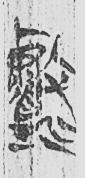{水睿攴}
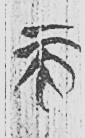而
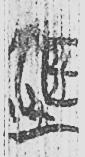{水𦣞土}
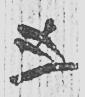之
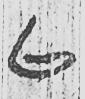㠯（以）
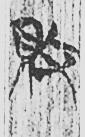敗
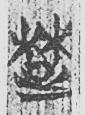楚
